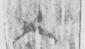五
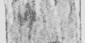十
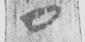四
